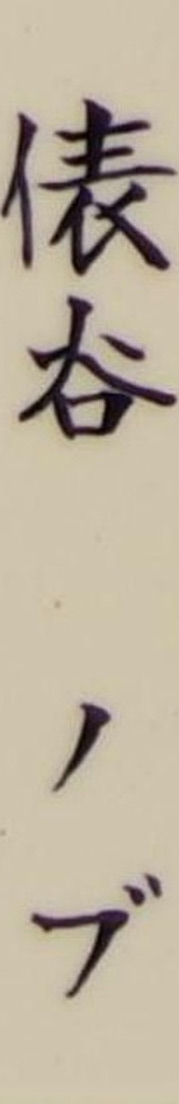俵谷ノブ
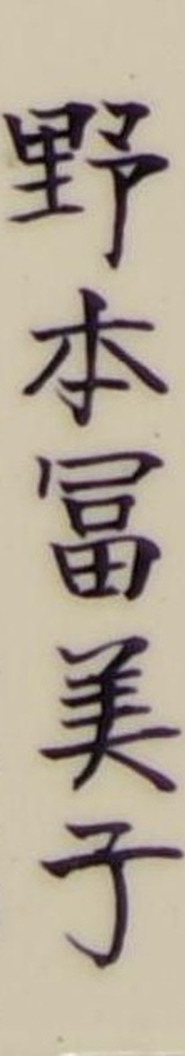野本冨美子
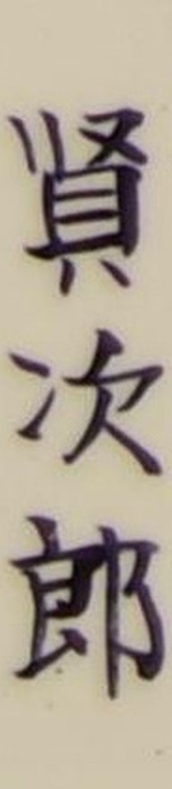賢次郎
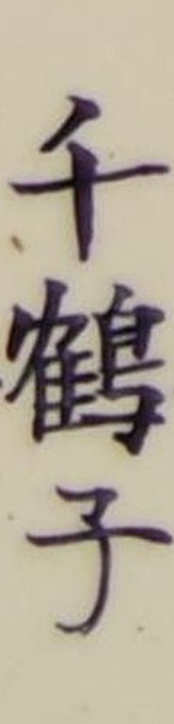千鶴子

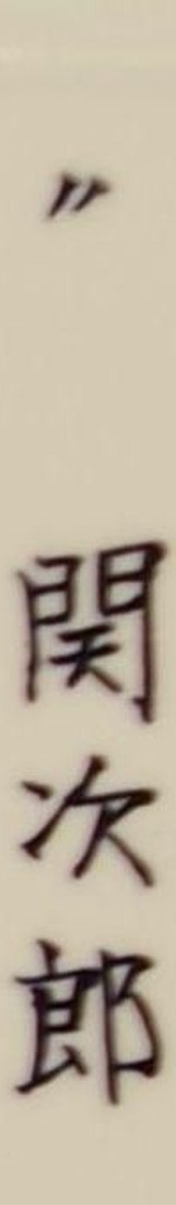関次郎
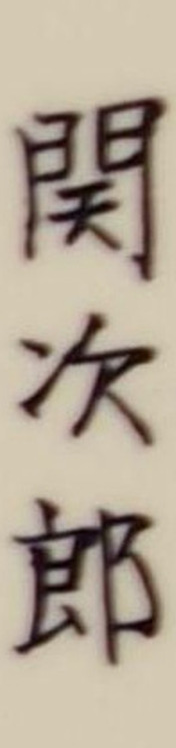関次郎
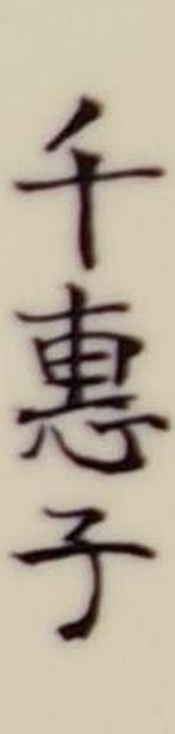千恵子
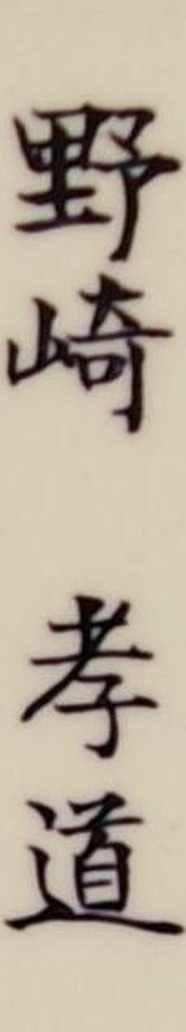野崎孝道
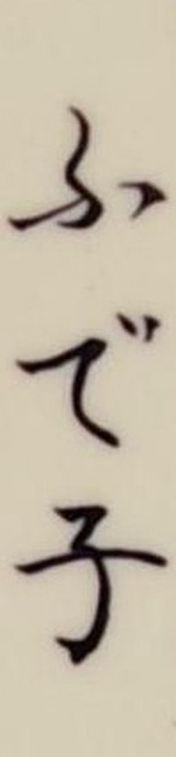ふで子
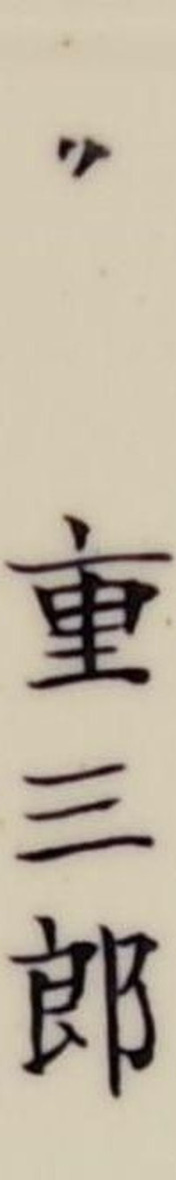重三郎
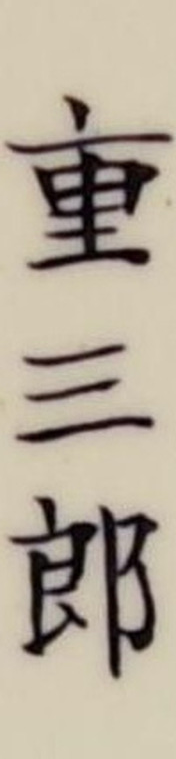重三郎
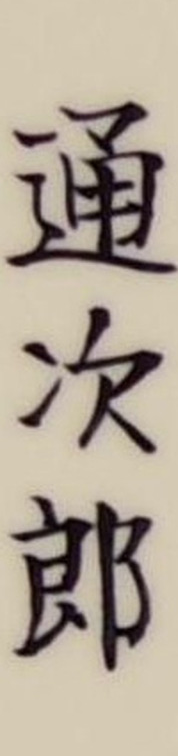通次郎
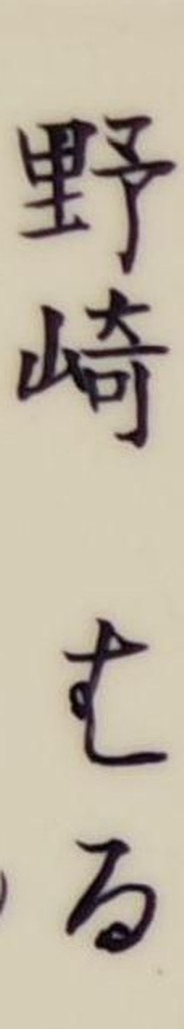野崎はる

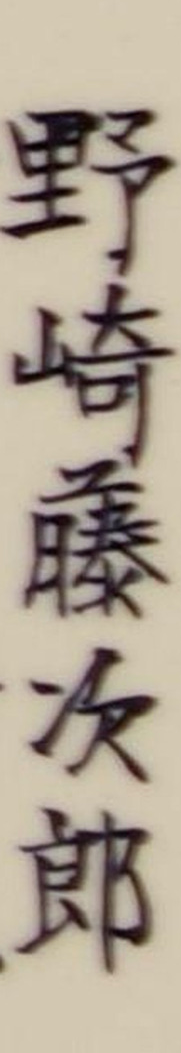野崎藤次郎
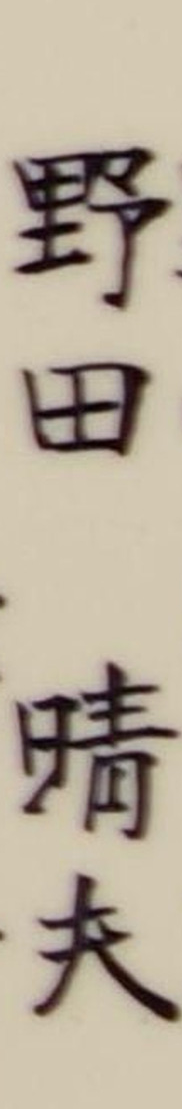野田晴夫
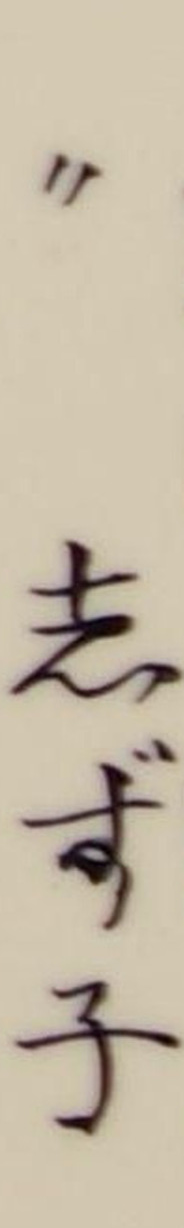しず子
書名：A~D
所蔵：koyasan kongobuji
